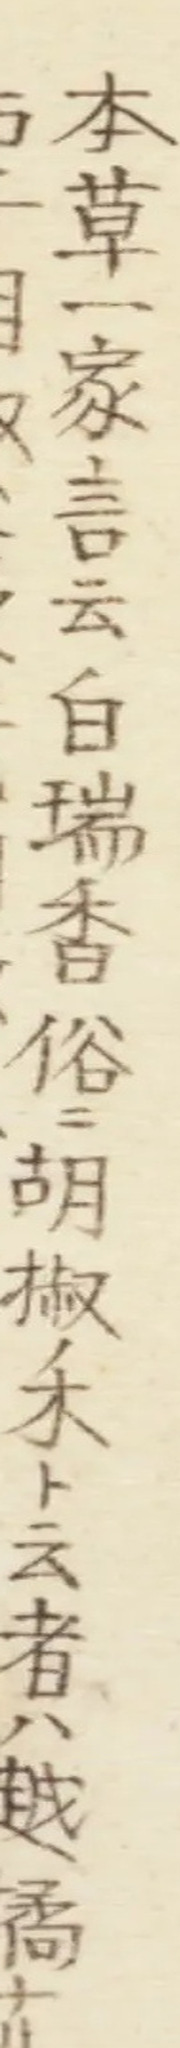本草一家言云白瑞香俗ニ胡椒ノ木ト云者ハ越橘ナリ
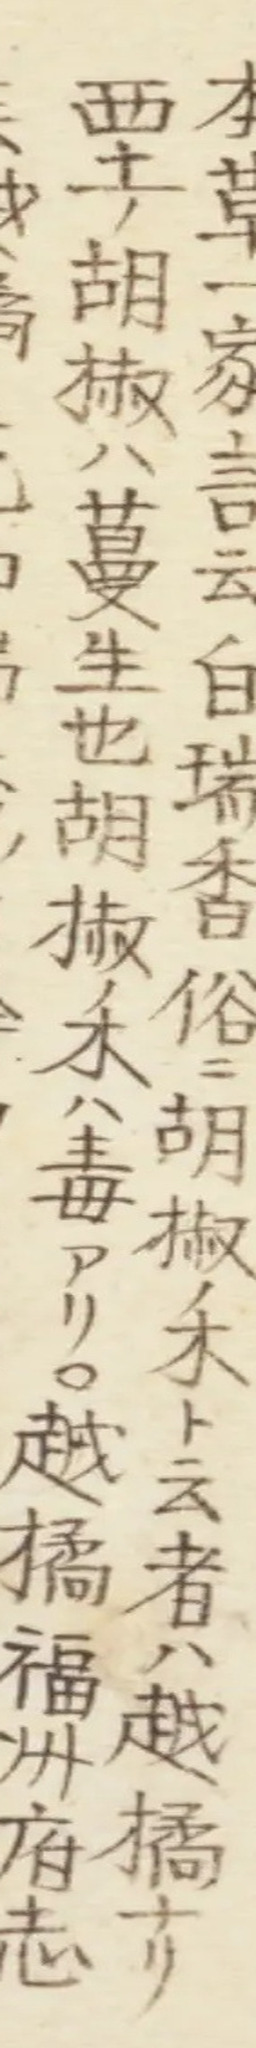西土ノ胡椒ハ蔓生也胡椒ノ木ハ毒アリ〇越橘福州府志
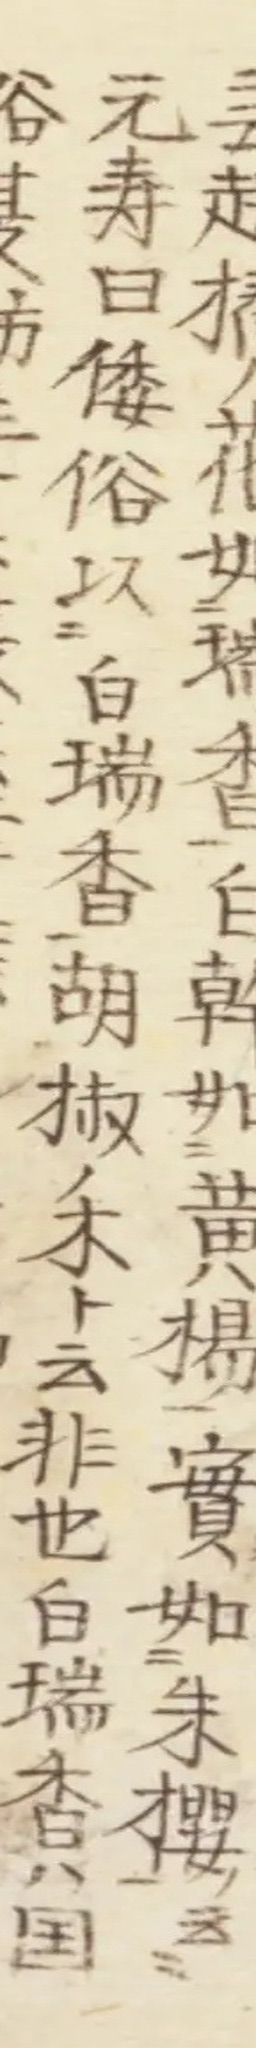元寿曰倭俗以白瑞香胡椒ノ木ト云非也白瑞香ハ国
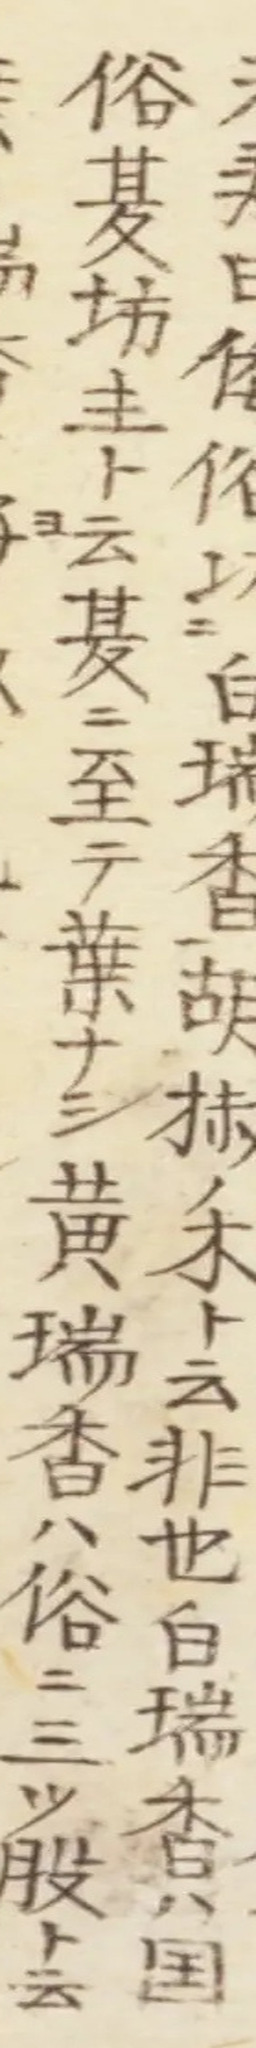俗夏坊主ト云夏ニ至テ葉ナシ黄瑞香ハ俗ニ三ツ股ト云
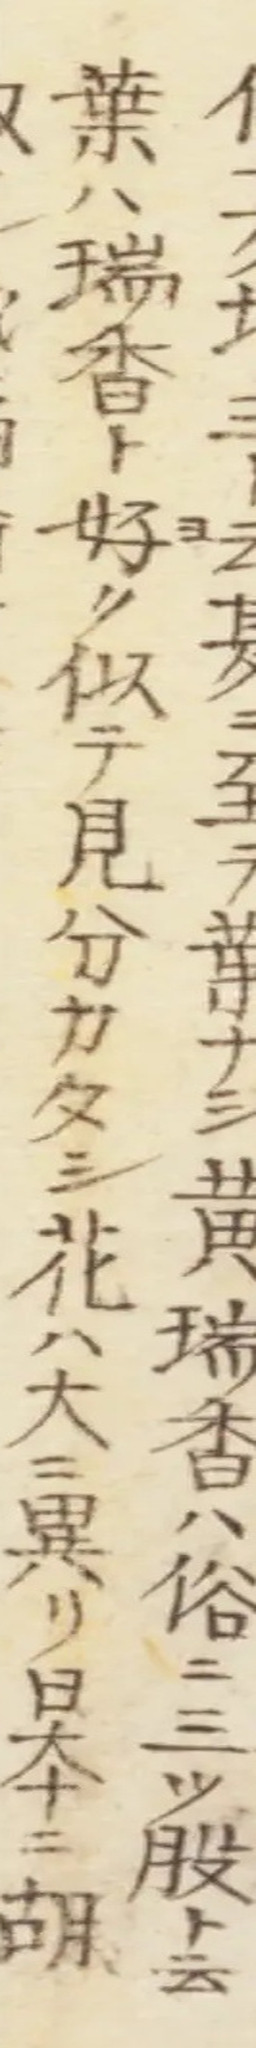葉ハ瑞香ト好ク似テ見分カタシ花ハ大ニ異リ日本ニ胡
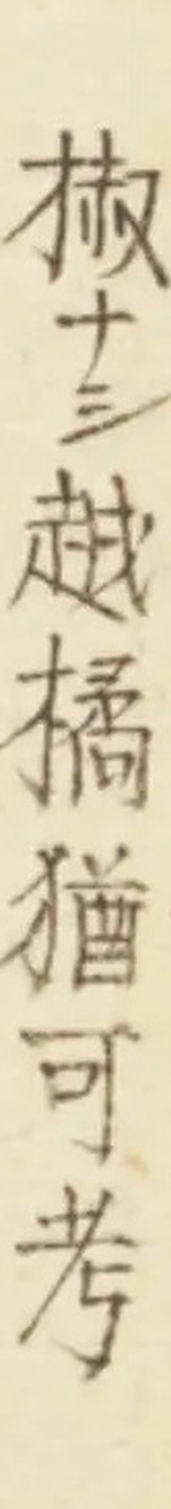椒ナシ越橘猶可考
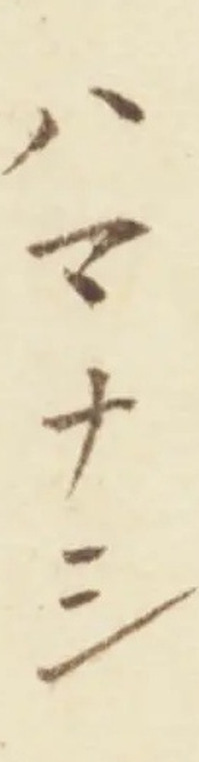ハマナシ
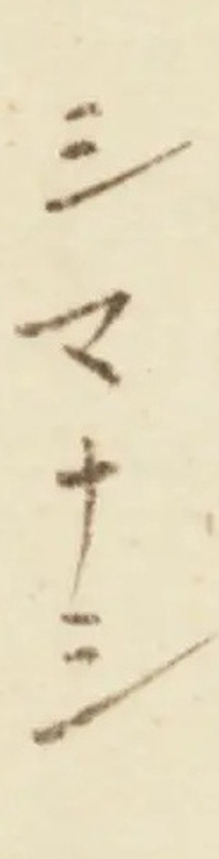シマナシ
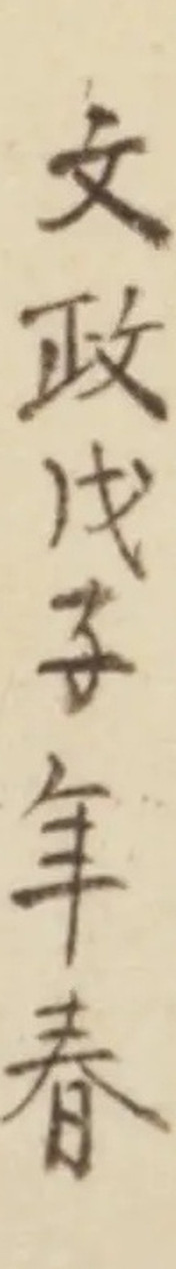文政戊子年春
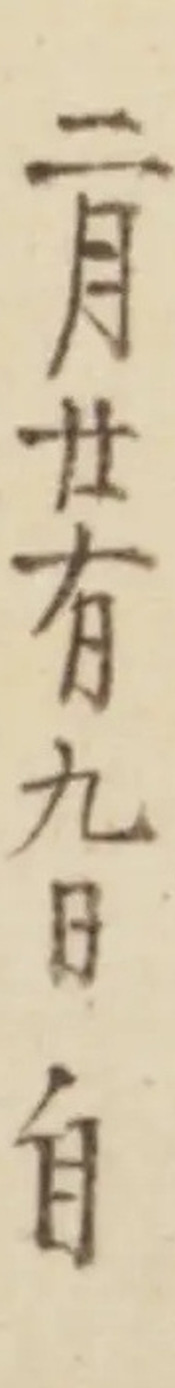二月廿有九日自
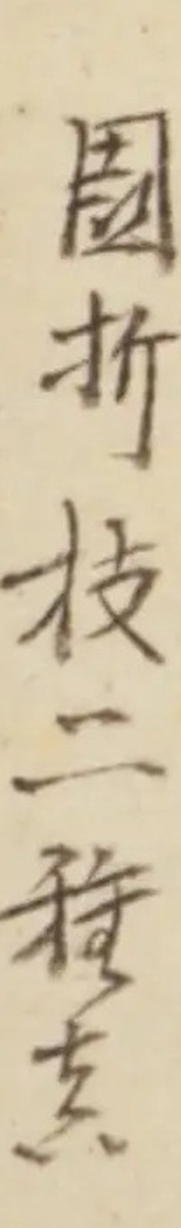園折枝二種真

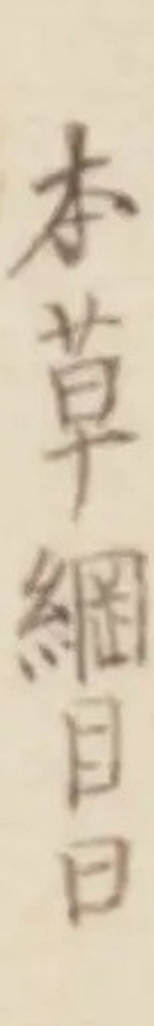本草綱目曰
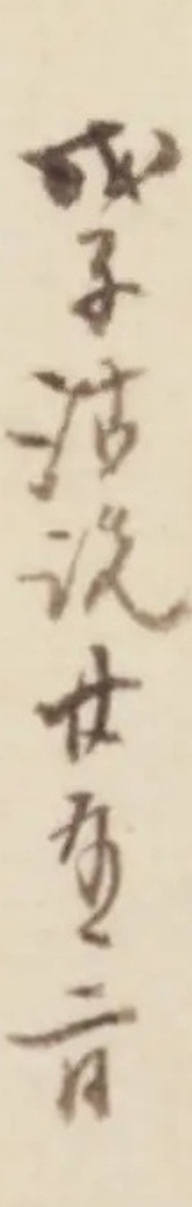戊子姑洗廿有二日
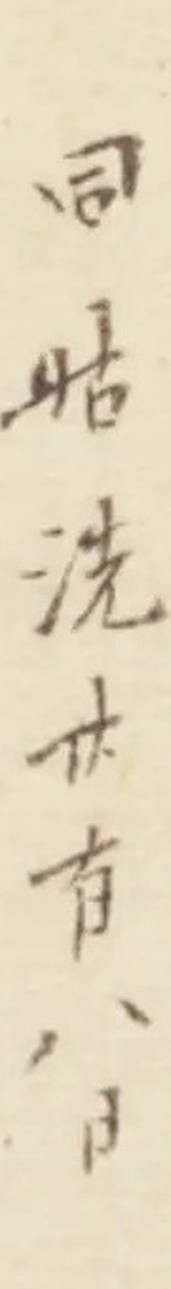同姑洗廿有八日

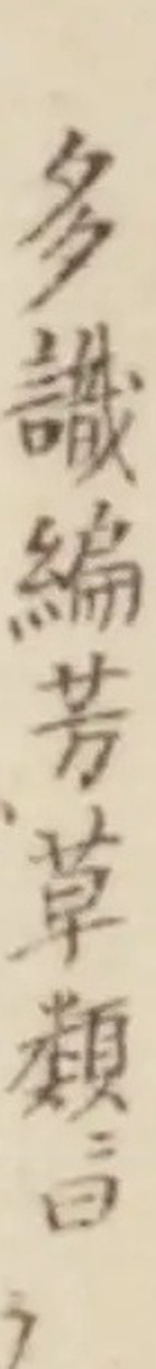多識編芳草類ニ曰
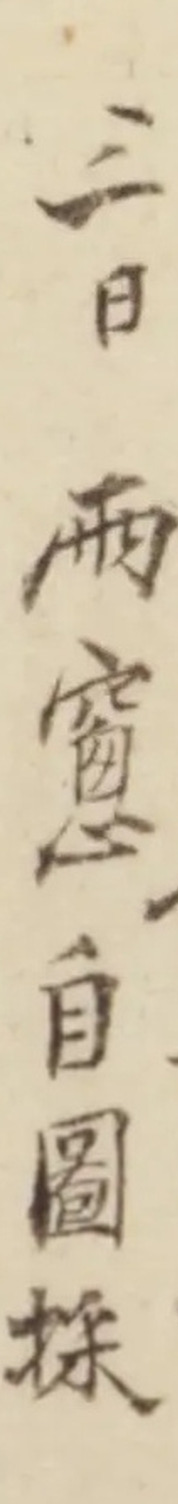三日雨窓自圓採
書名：梅園草木花譜春之部. 3
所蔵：国立国会図書館 National Diet Library, JAPAN
